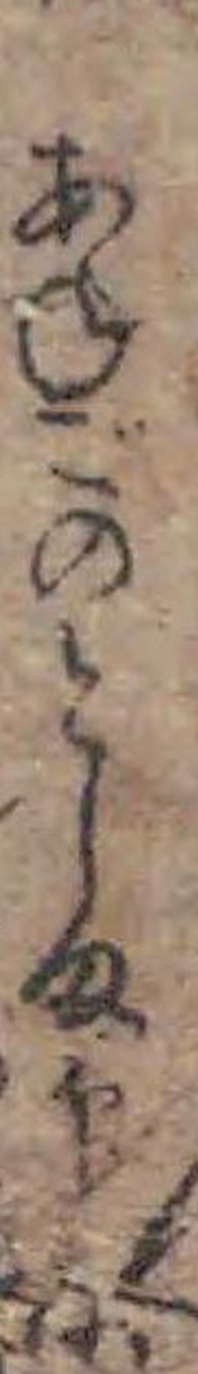あねごのとしま印に
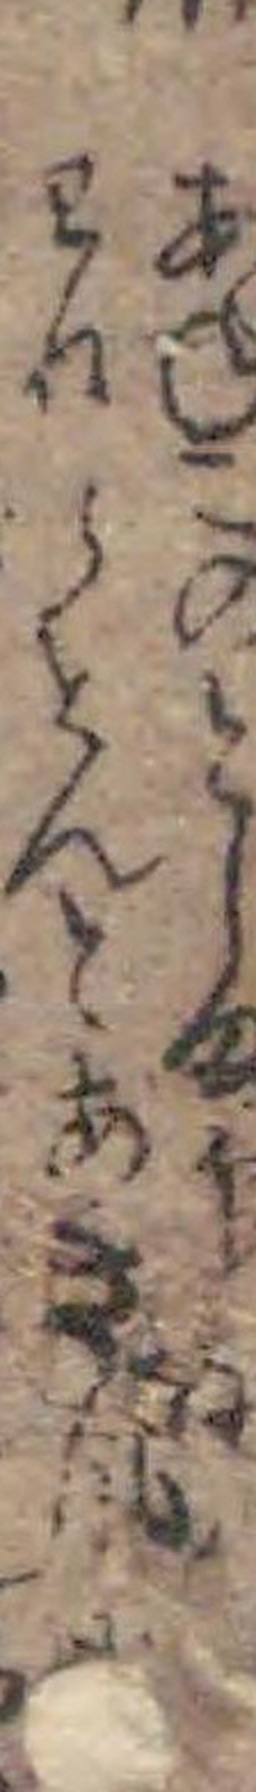われらとんとあき風に
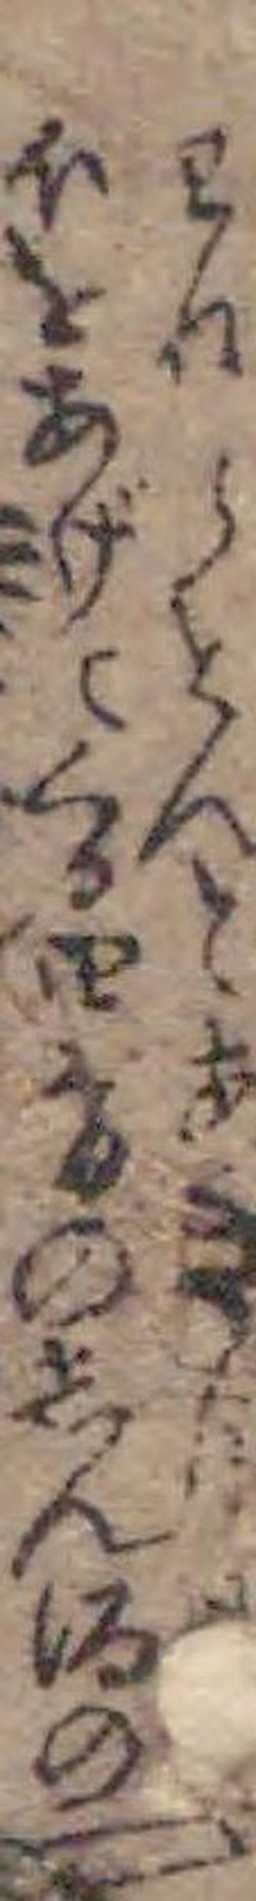ほをあげてくる四方のしん酒の
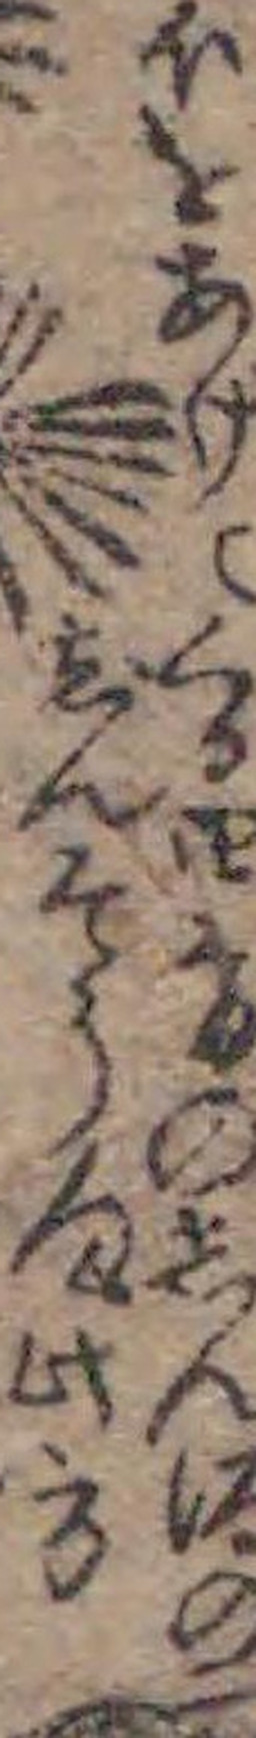しんそう様此方
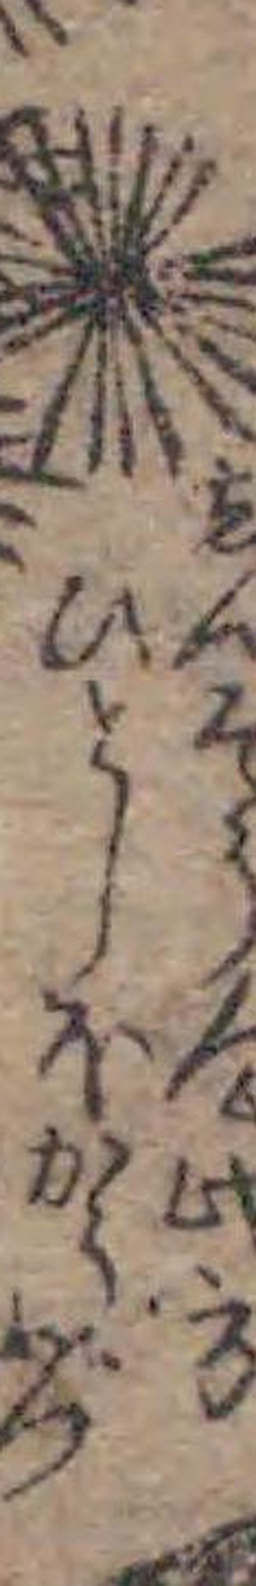ひとしほかうぶつ
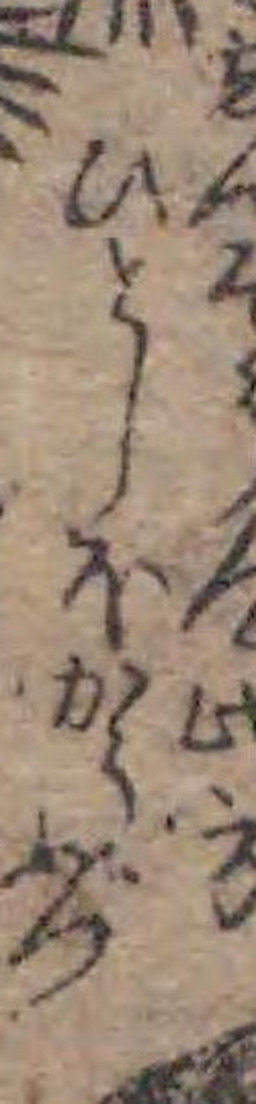ひとしほかうぶつ
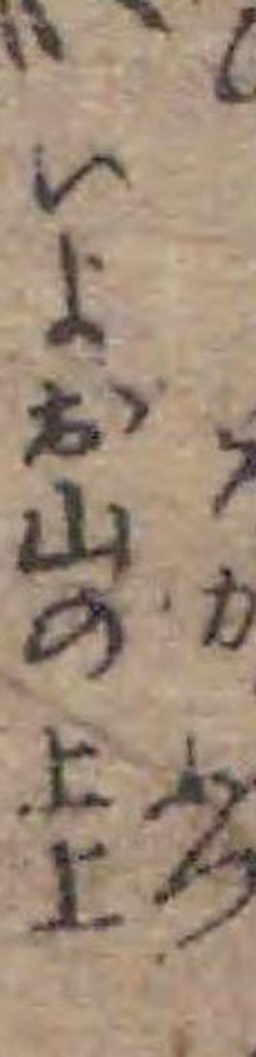いよお山の上上
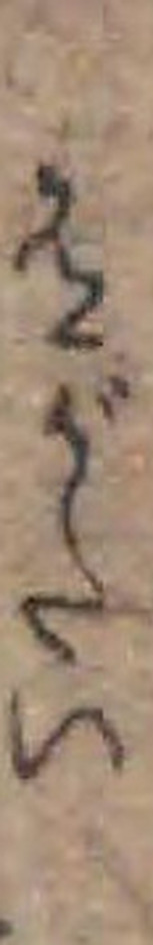有がたい
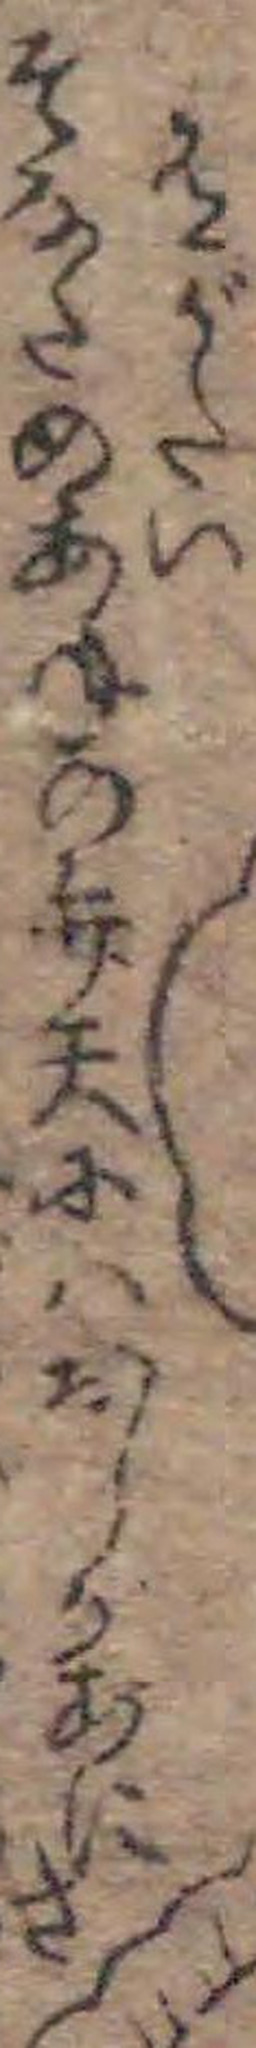そなたのあねの弁天にはおしりあにさ
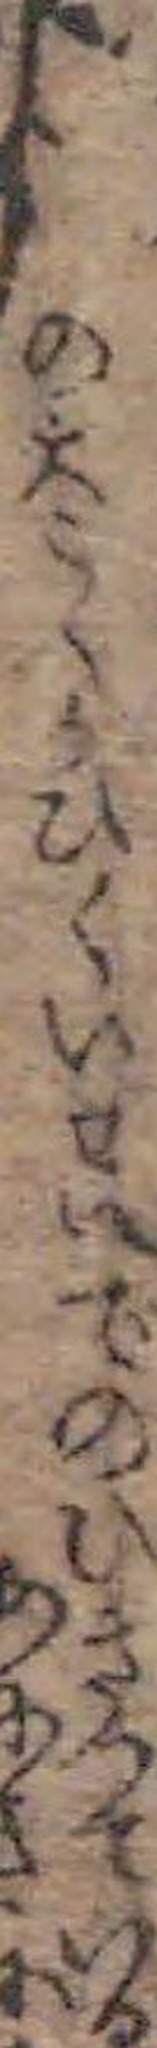の大こくかひくいせいでのひきつているから
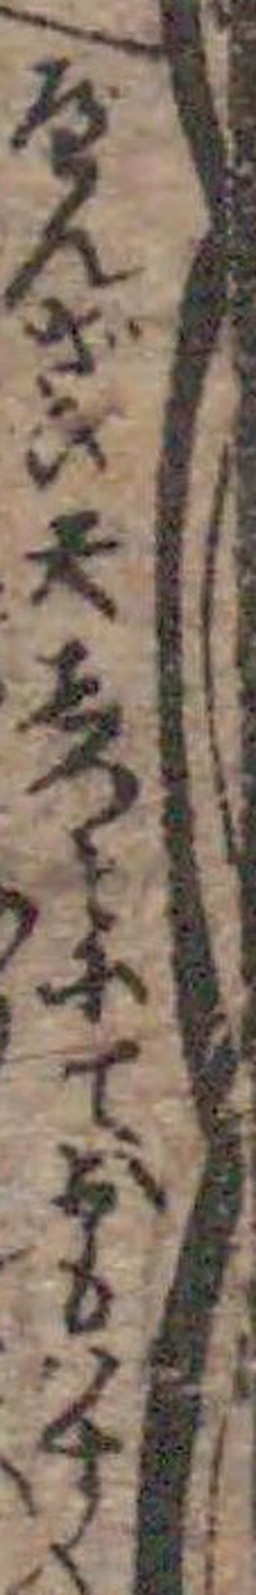へんざい天しつとにておもはす
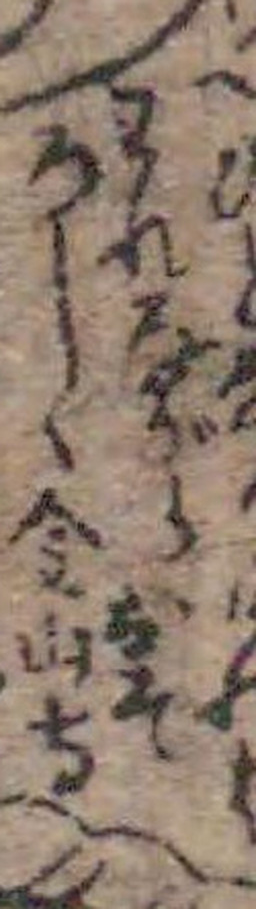ろしく金山寺
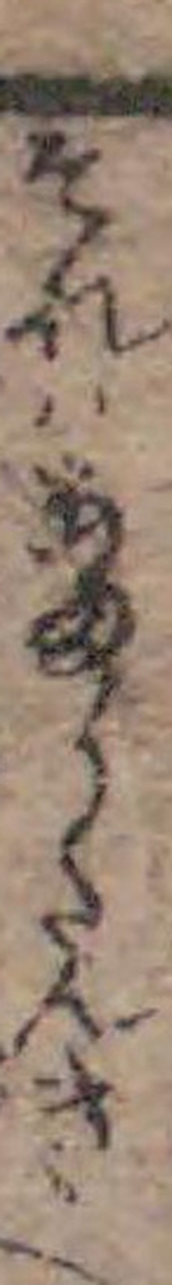それはあまりたんき
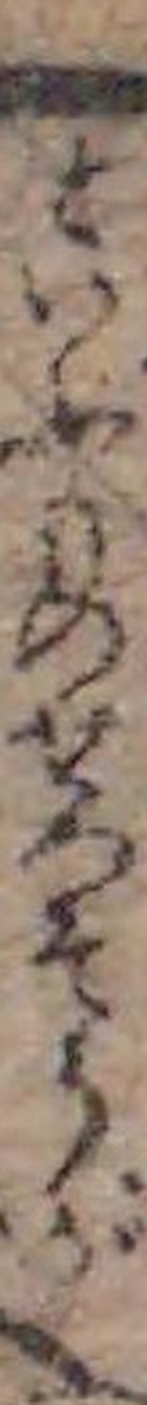といふものせつそうが
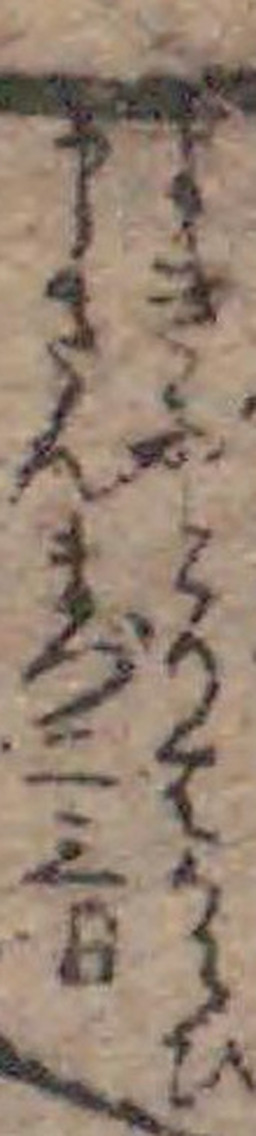申さんまづ二三日
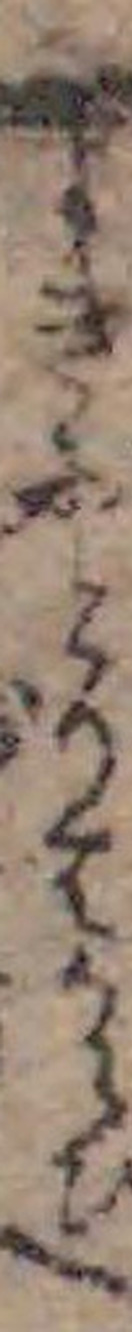よきにとりはからひ
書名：蛭子大黒壮年過 : 2巻
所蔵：国立国会図書館 National Diet Library, JAPAN
